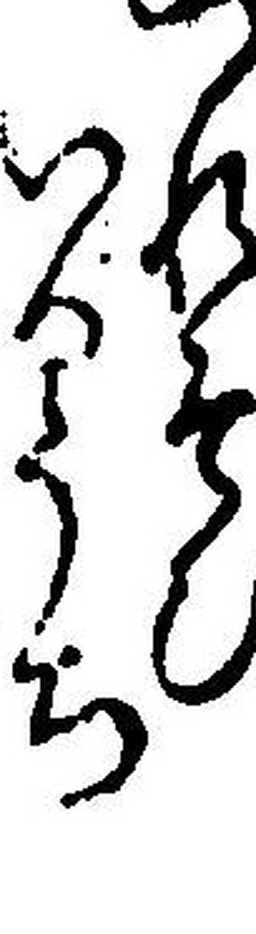いるうち
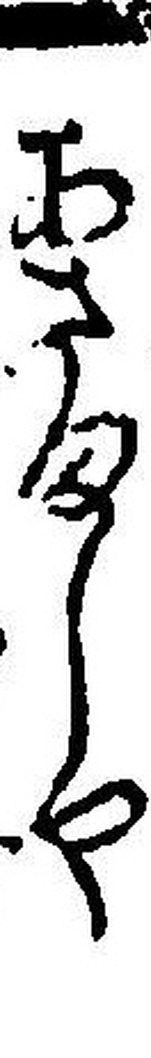あさましや
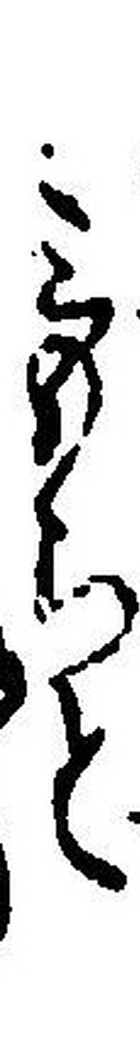ももちと
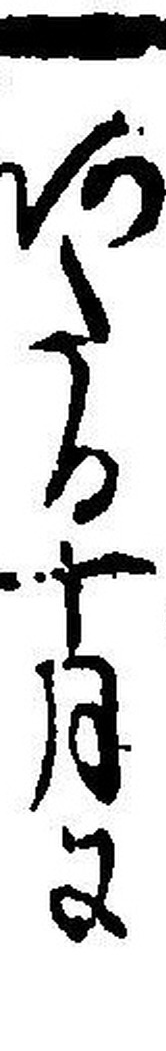あたる十月に
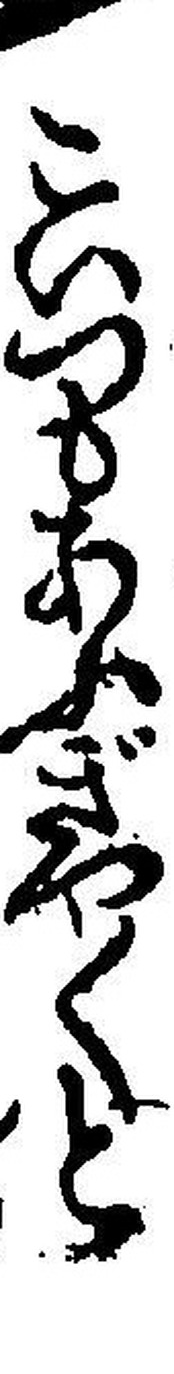こいつもあふぎや〳〵と
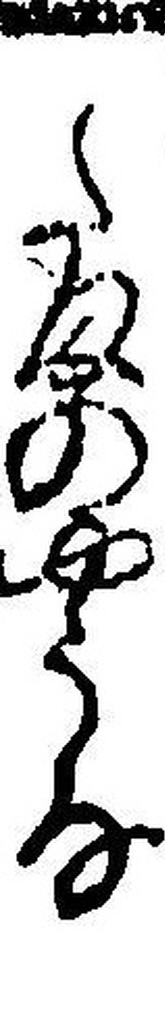たまのやうな
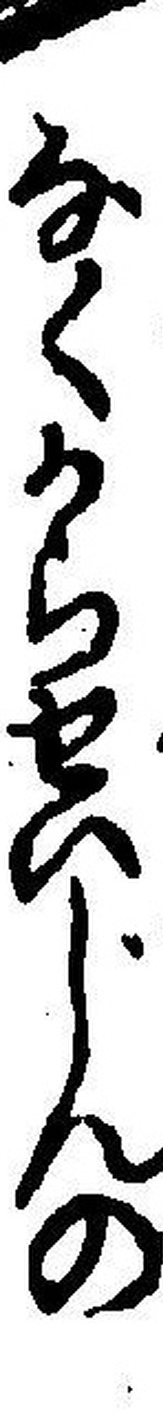なくからせいじんの
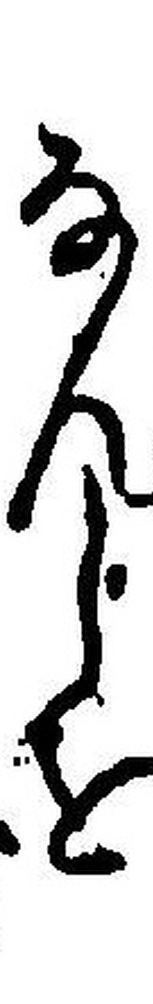なんじを
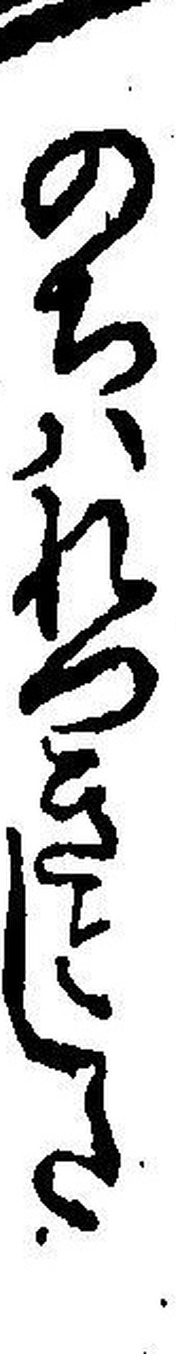のちはれつきとした
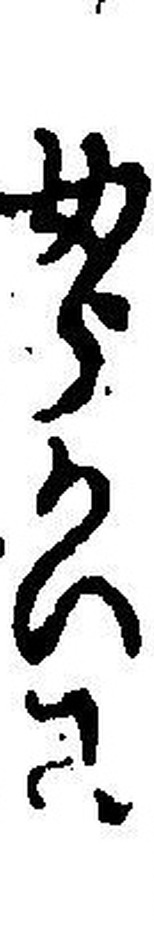女郎かいに
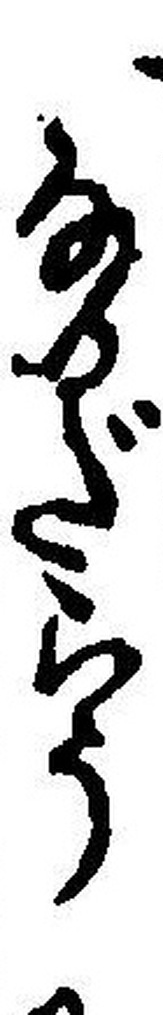なるだらう

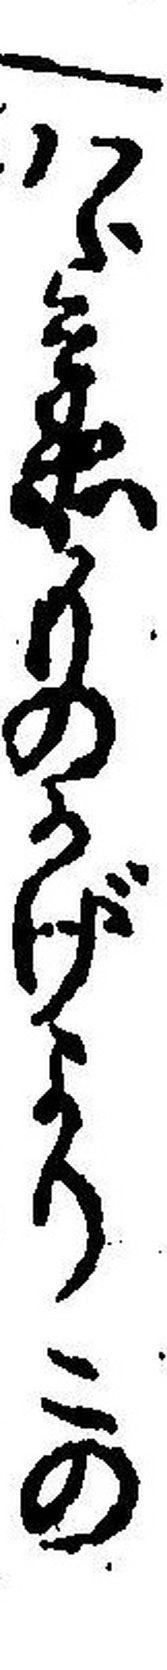八郎兵衛ものかげよりこの
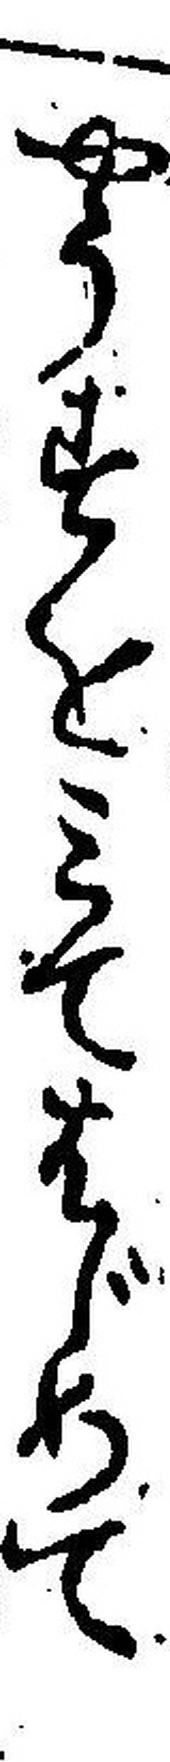やうすをみてはじめて
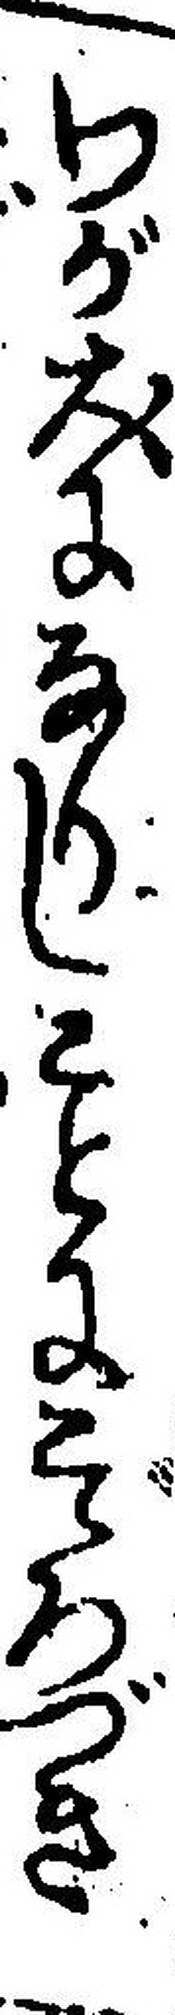わが犬になりしことにこゝろづき
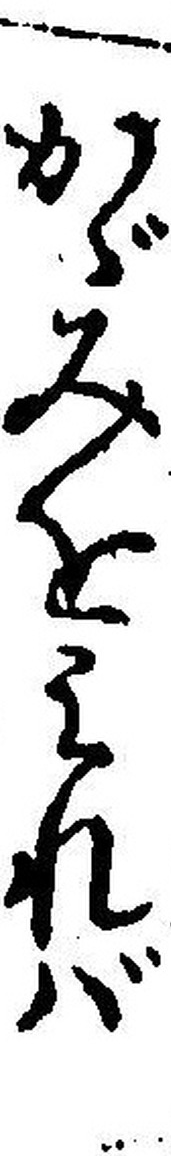かゞみをみれば
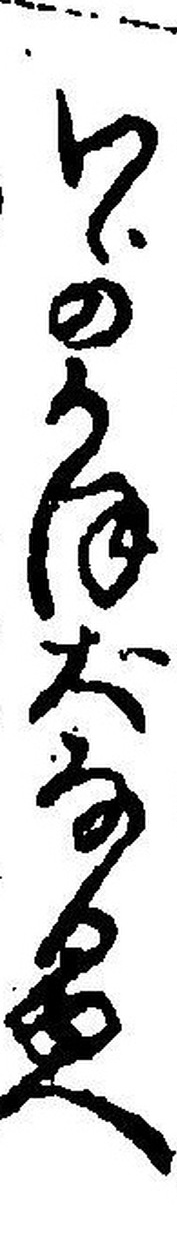わがかほ犬なるゆへ
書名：花芳野犬斑 / 山東京伝作
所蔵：東京大学総合図書館 General Library in the University of Tokyo, JAPAN
